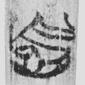面
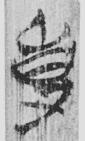事
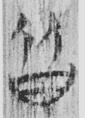皆
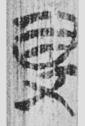○（得）
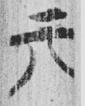亓（其）
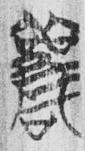嚾（勸）
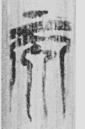而
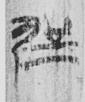○（強）
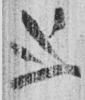之
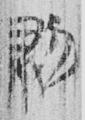則
